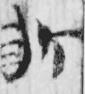斨
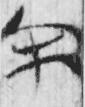牢
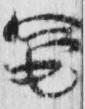𠁩
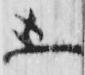之
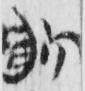斨
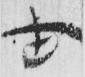古
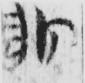斨
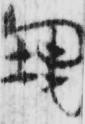○（坉）
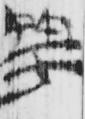竽
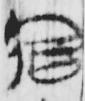倌
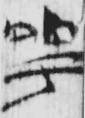竽
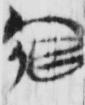倌
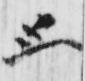之
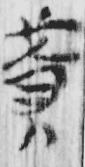貸
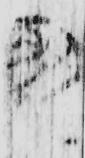解
